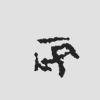雨
